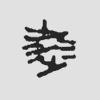涉
